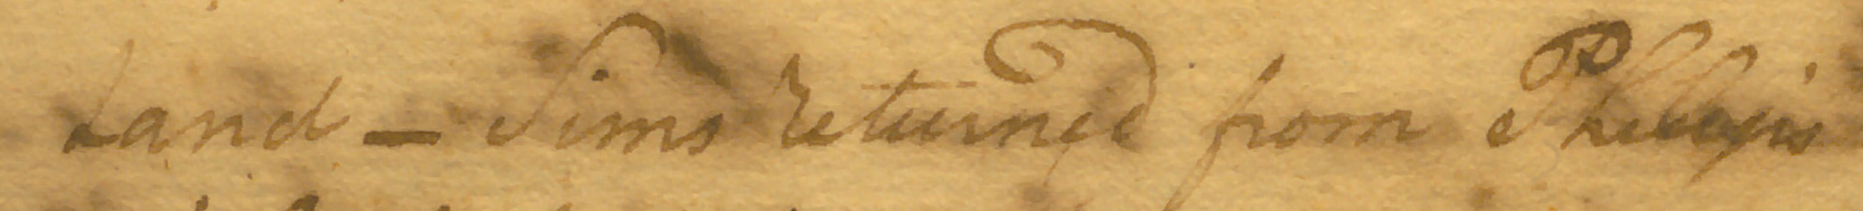Land- Sims returned from Philips
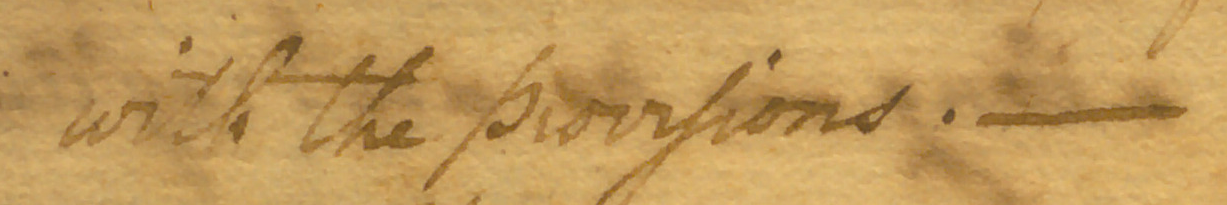with the provisions.-
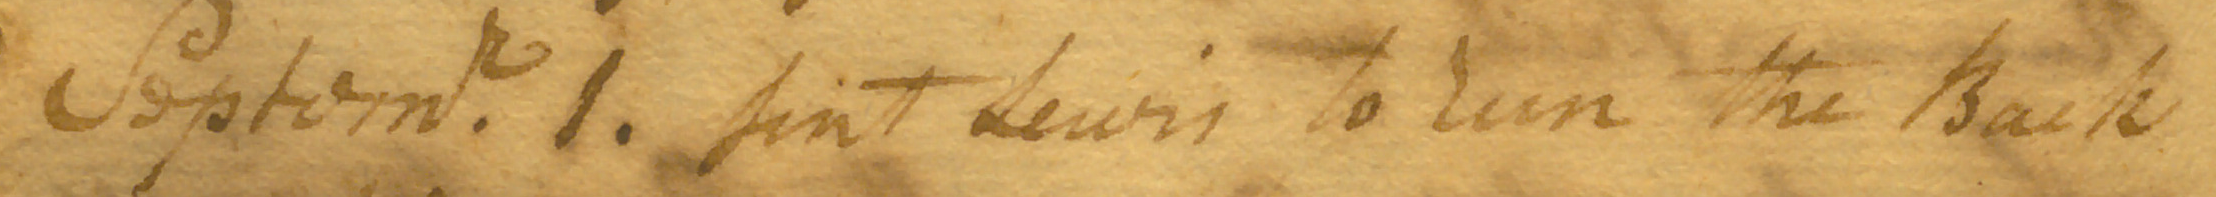Septem^r. 1. Sent Lewis to run the Back
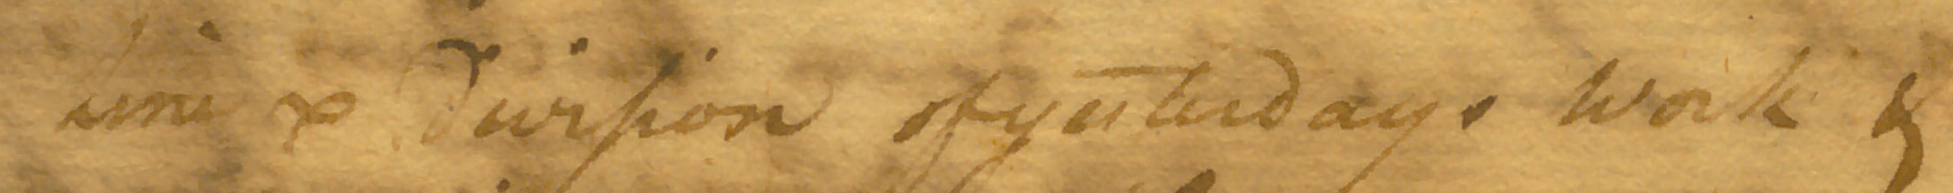Line & decision of yesterdays work &
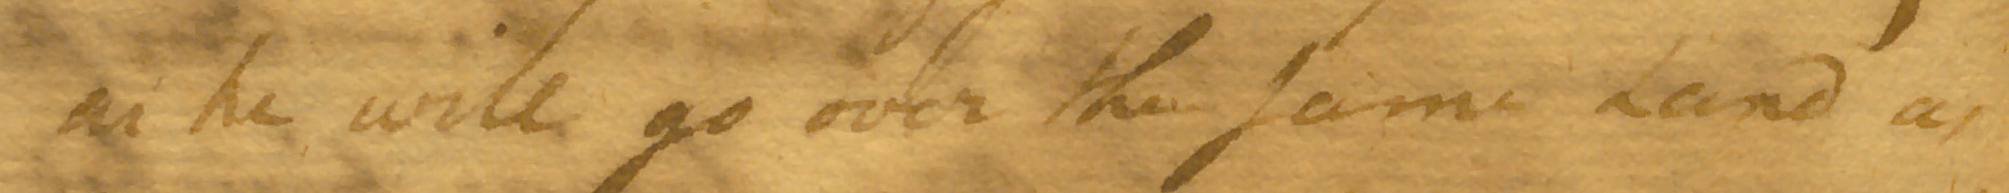as he will go over the same Land as
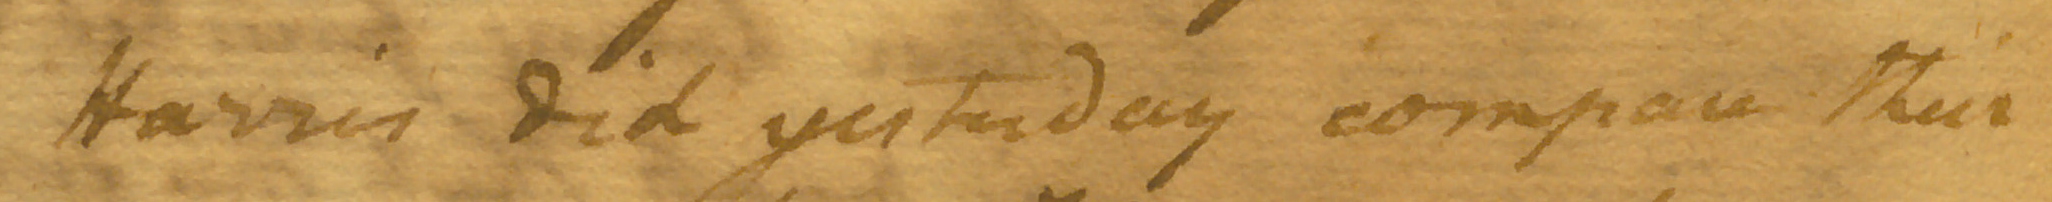Harris did yesterday compare their
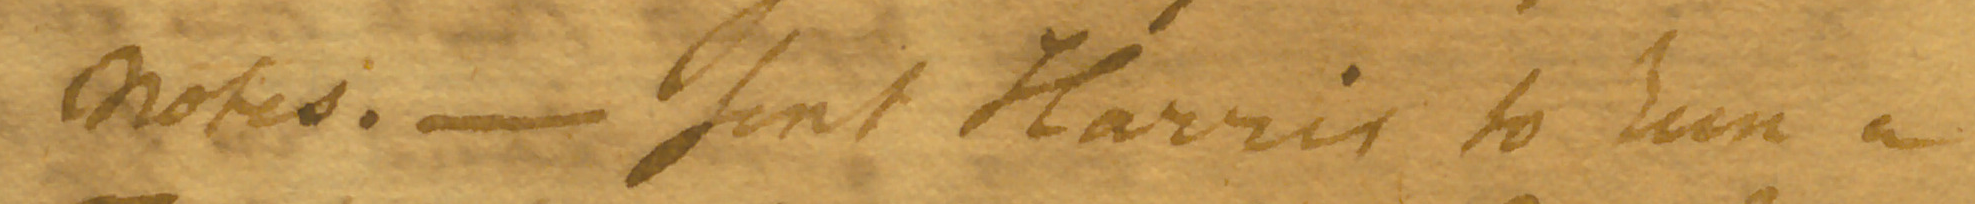notes.- Sent Harris to run a
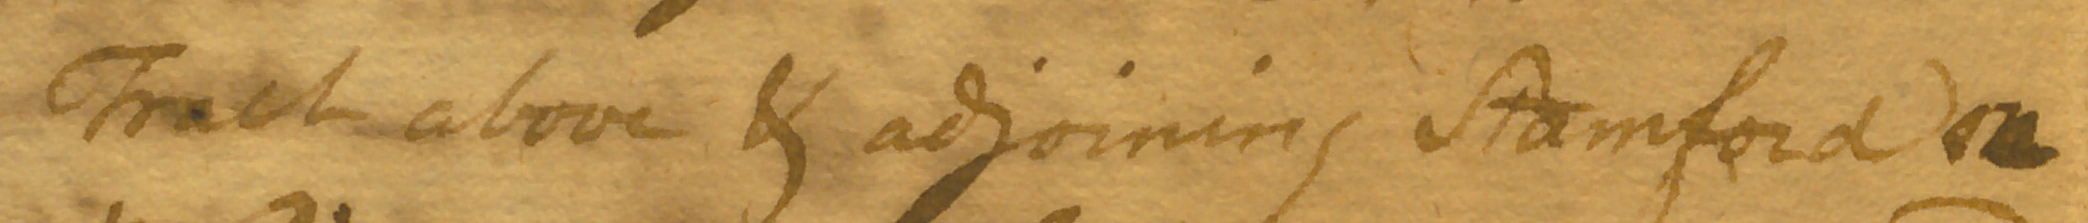Tract above & adjoining Stamford on
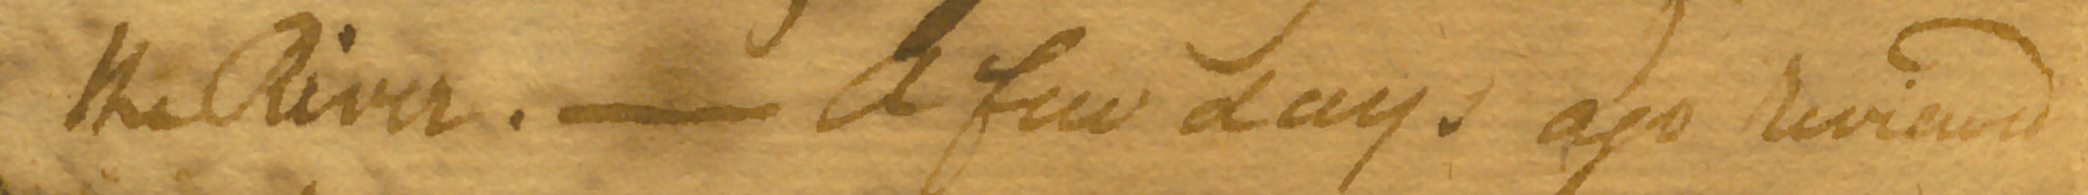the River.- A few days ago reviewed
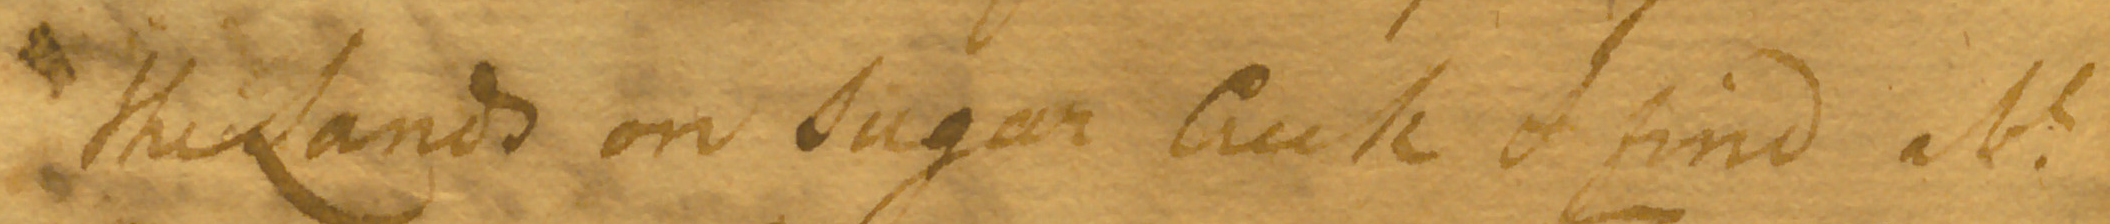the Lands on Sugar Creek & find ab^t.
